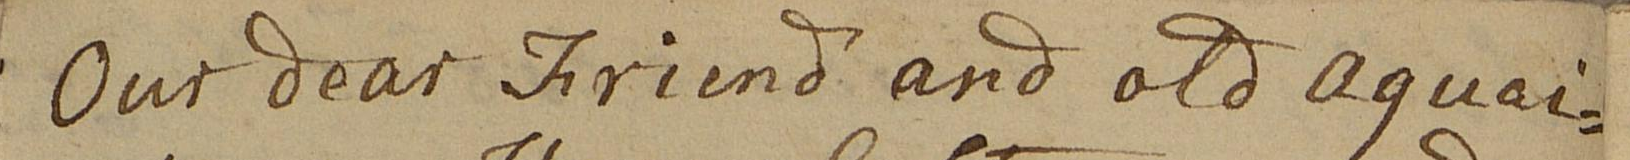Our dear Friend and old aquai-
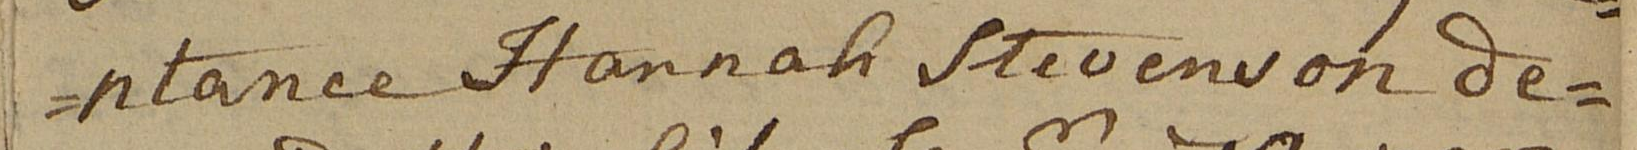-ntance Hannah Stevenson de-
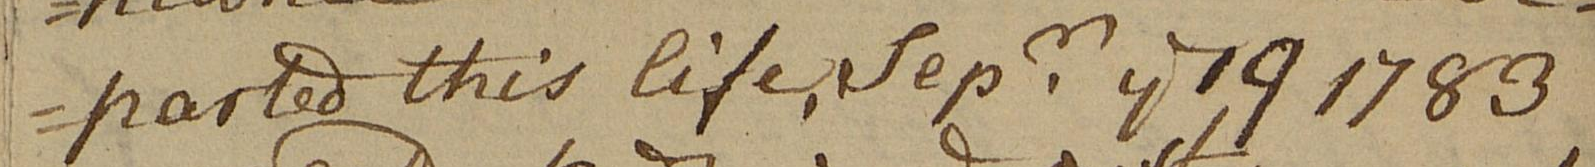-parted this life, Sep^r. y^e 19 1783
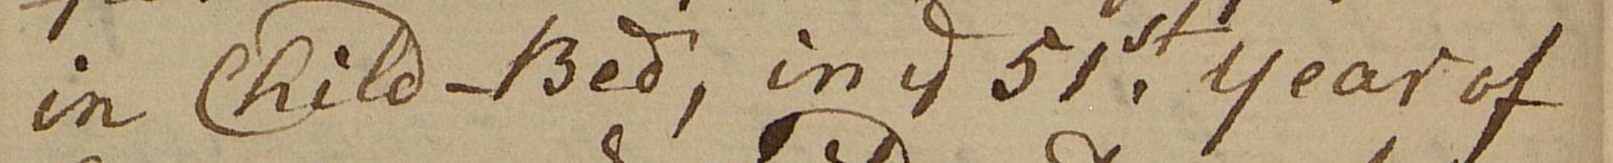in Child- Bed, in y^e 51^st. Year of
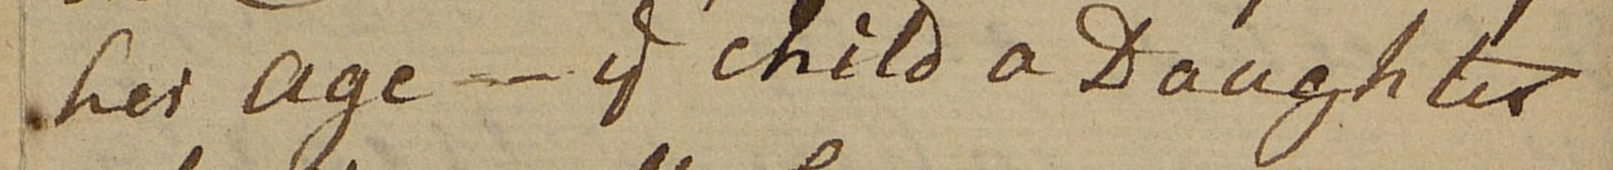her age- y^e child a Daughter
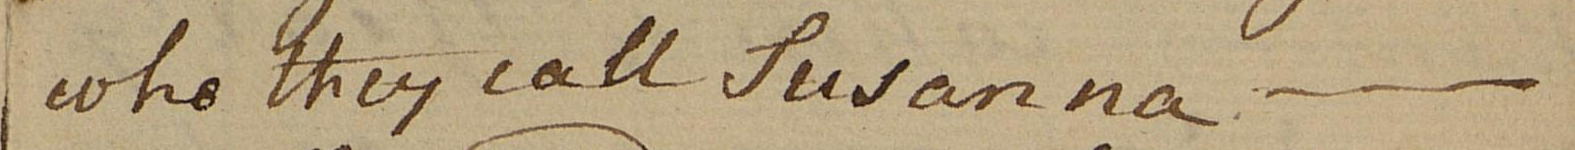who they call Susanna.-
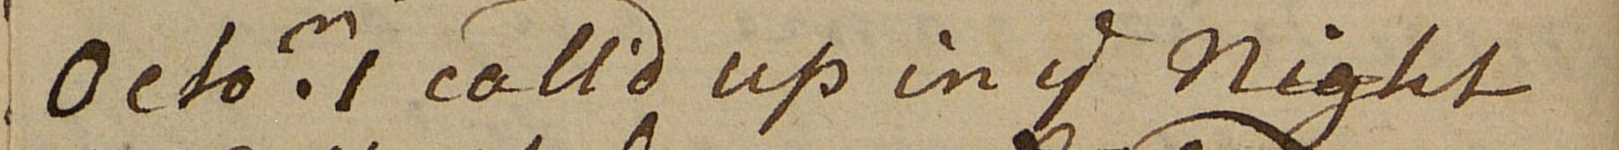Octo^r. 1 call'd up in y^e Night
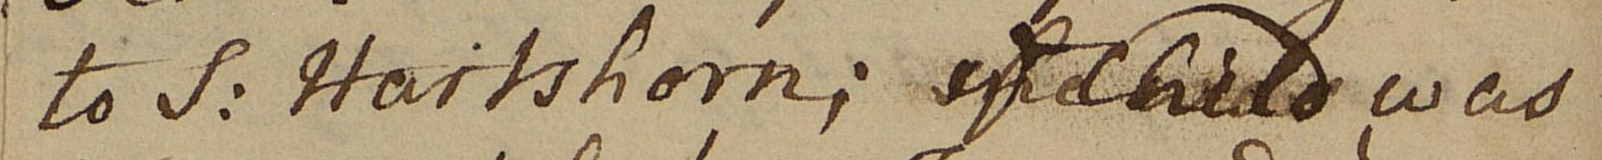to S: Hartshorn; y^e child was
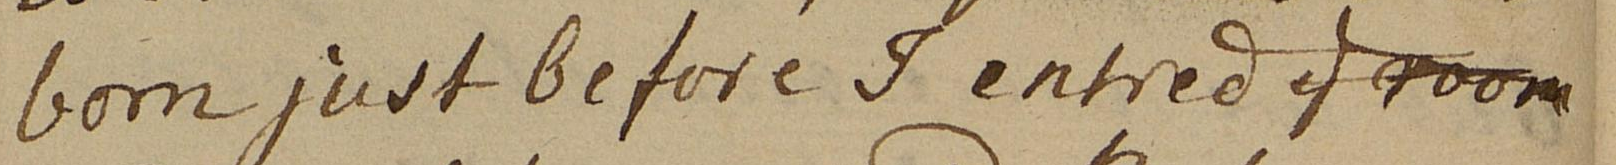born just before I entred y^e room
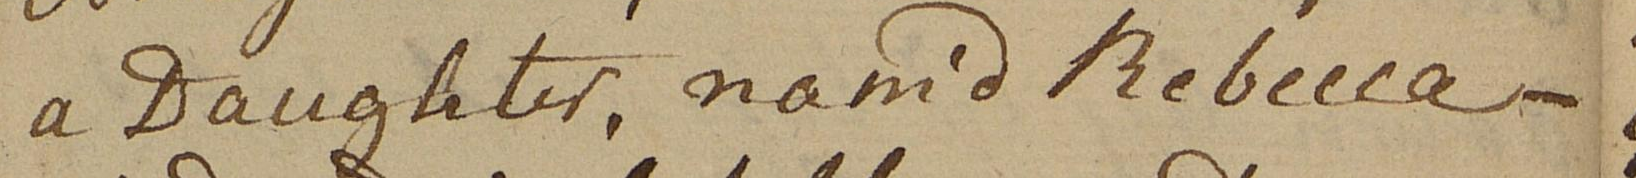a Daughter, nam'd Rebecca-
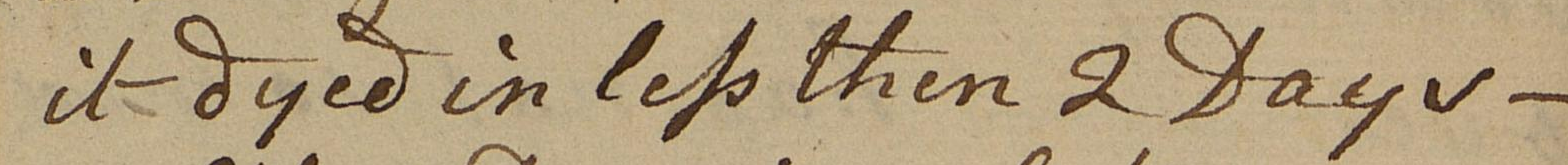it dyed in less then 2 Days-
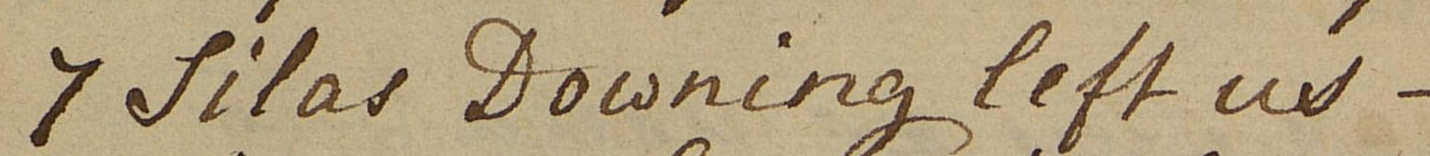7 Silas Downing left us-
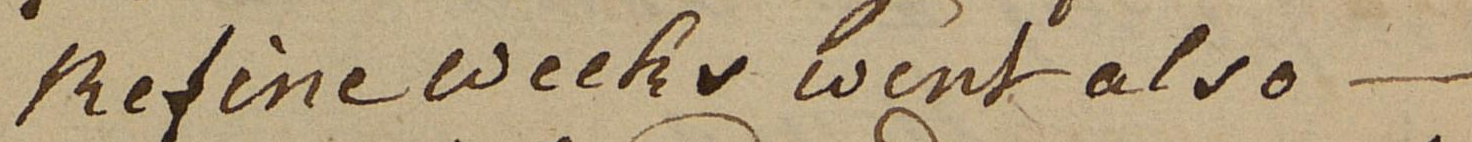Refine weeks went also-
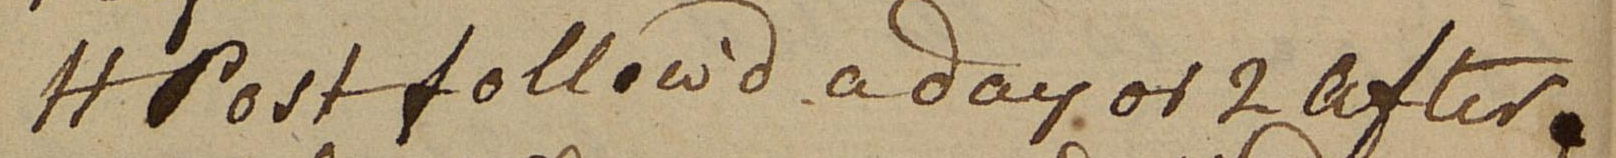H Post follow'd a day or 2 after.
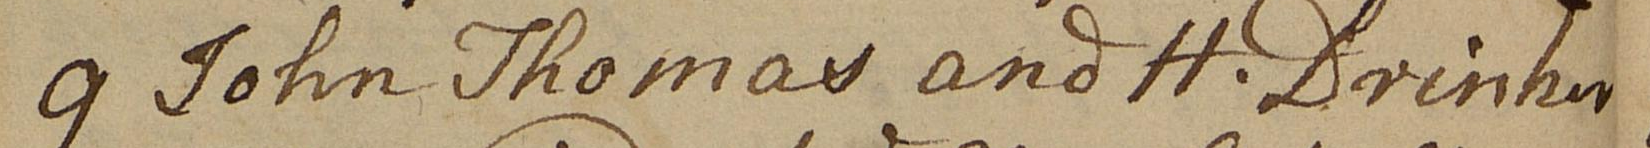9 John Thomas and H. Drinker
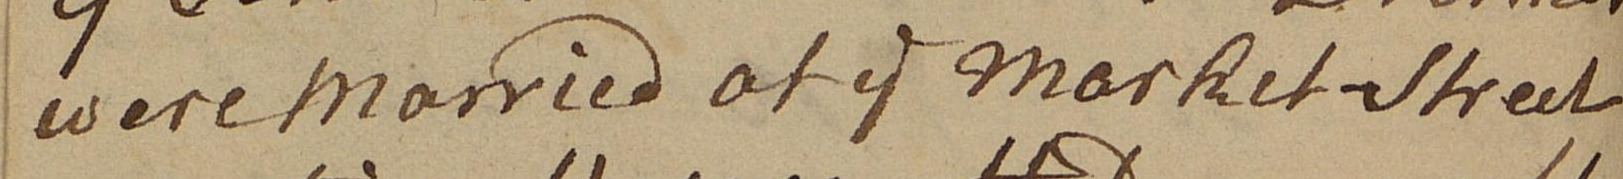were married at y^e Market street
